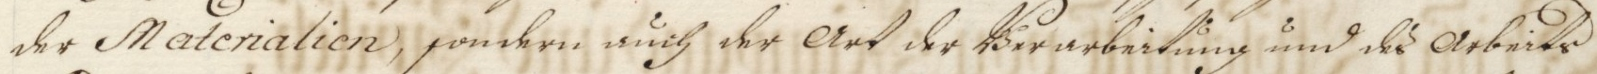der Materialien, sondern auch der Art der Verarbeitung und des Arbeits
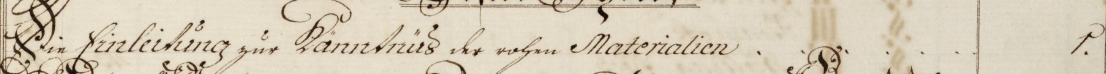Die Einleitung zur Känntnüs der rohen Materialien. 1.
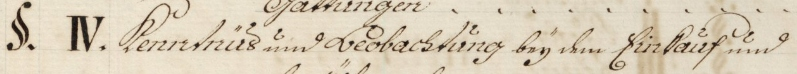§. IV Kenntnüs und Beobachtung bey dem Einkauf und
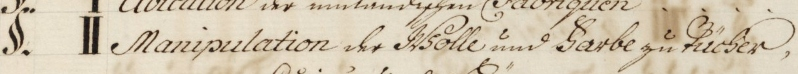§. II Manipulation der Wolle und Farbe zu Tücher,
